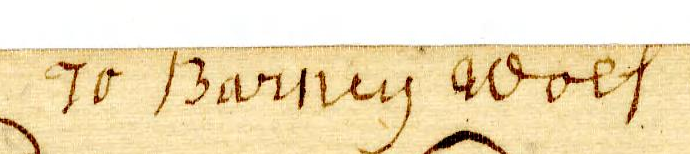To Barney Wolf
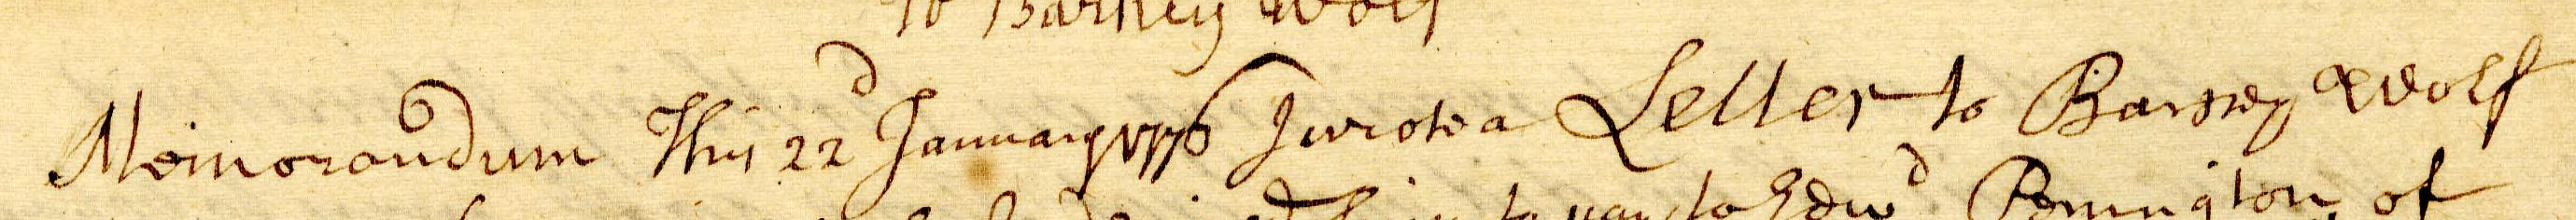Memorandum This 22^d January 1776 I wrote a Letter to Barney Wolf
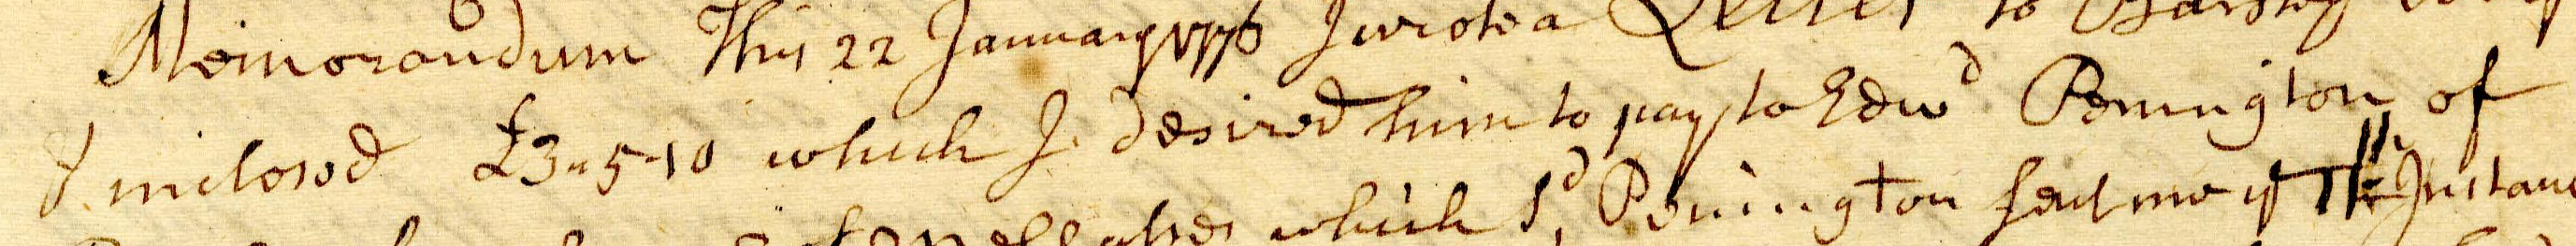I inclosed £..5.10 which I desired him to pay to Edw^d Penington of
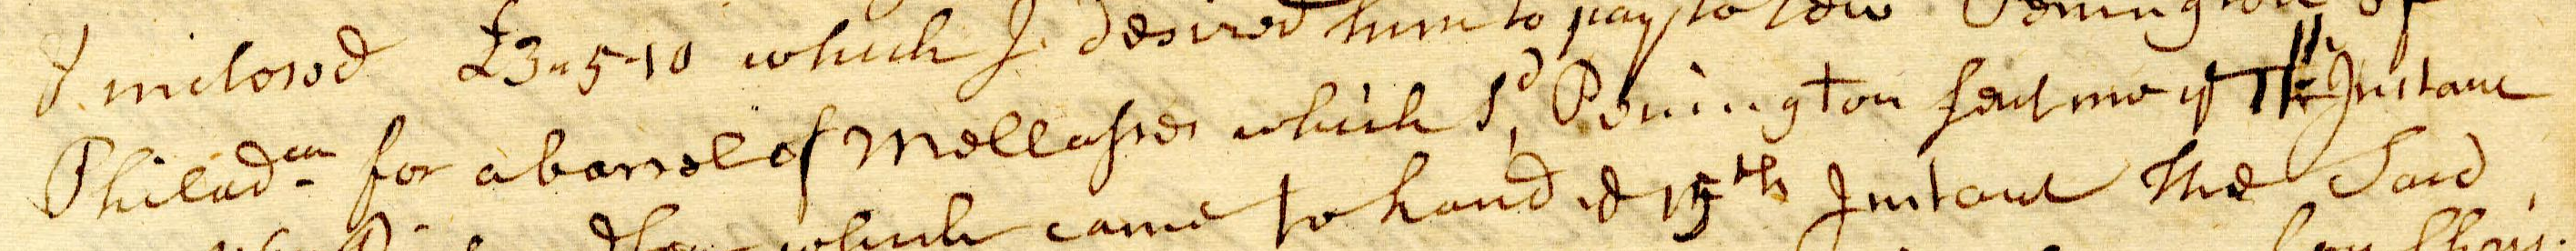Philad^ia. for a barrel of Mollasses which S^d. Penington sent me y^e 11^th Instance
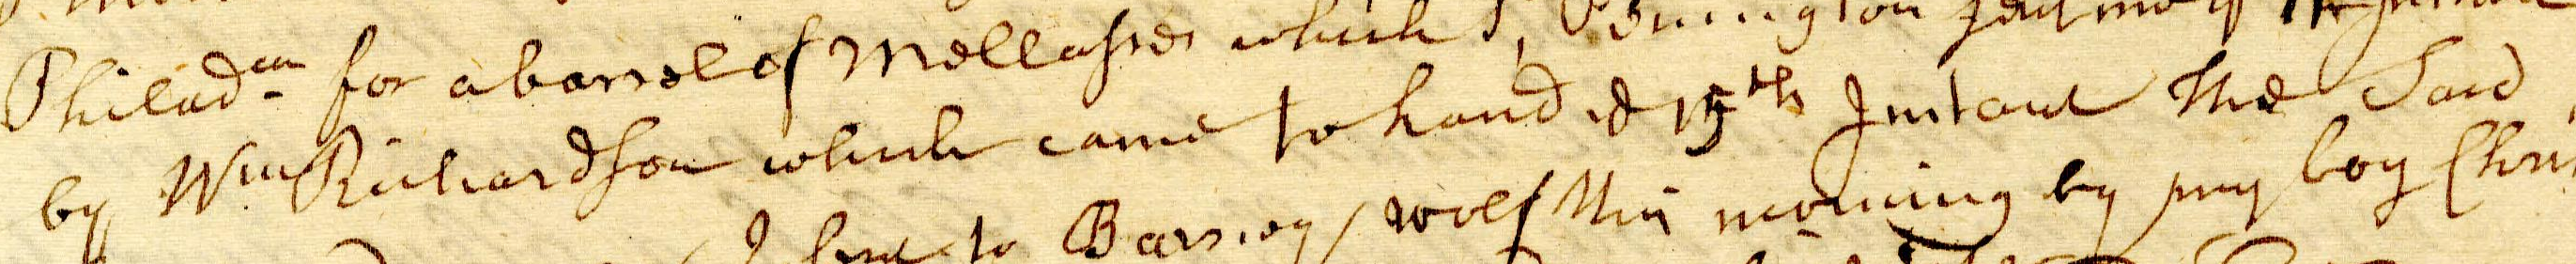y W^m. Richardson which came to hand y^e 15^th Instance the Said
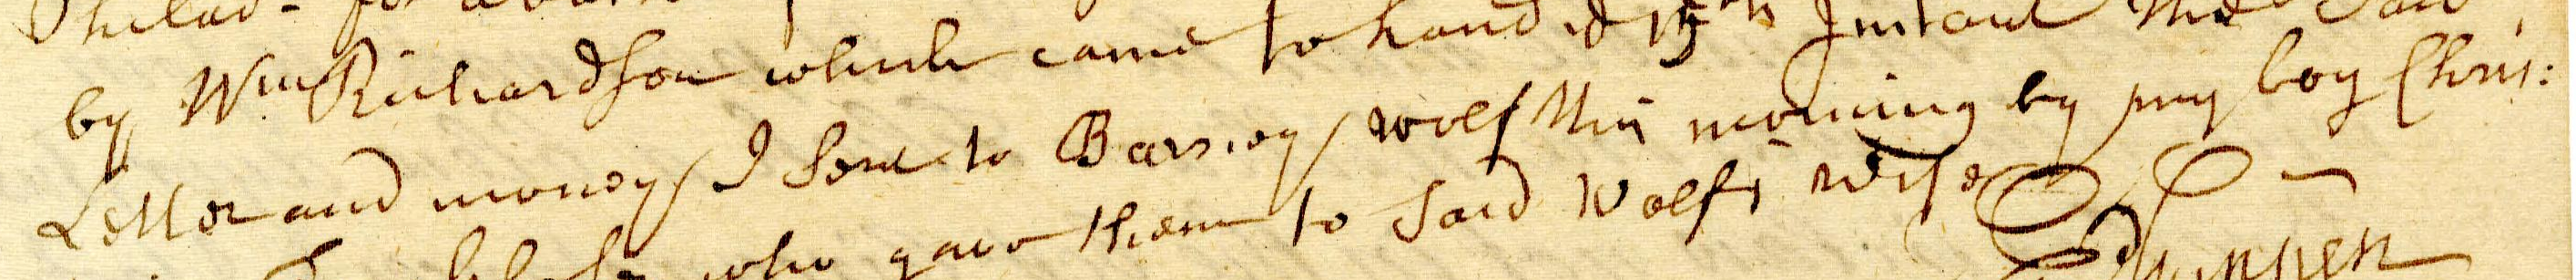Letter and money I Sent to Barney Wolf this morning by my boy Chris:
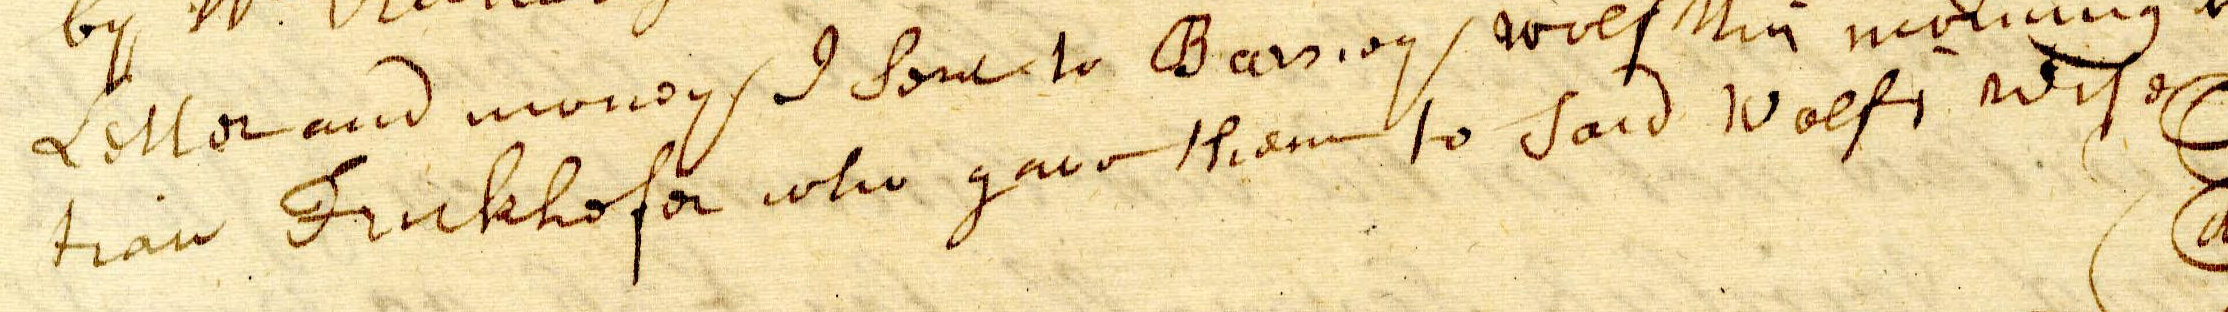tian Frinkhofer who gave them to Said Wolf's Wife
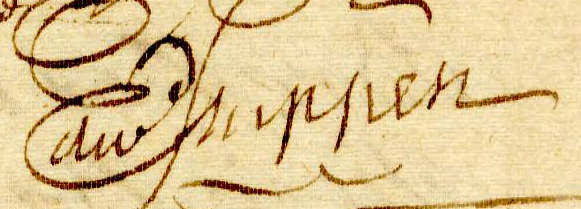Edw^d Shippen
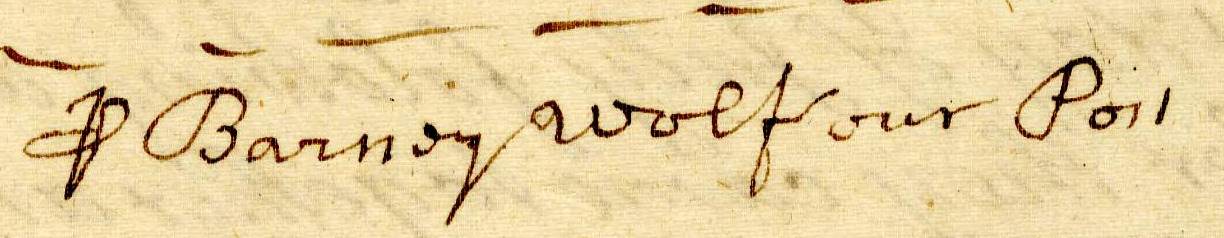per Barney Wolf our Post
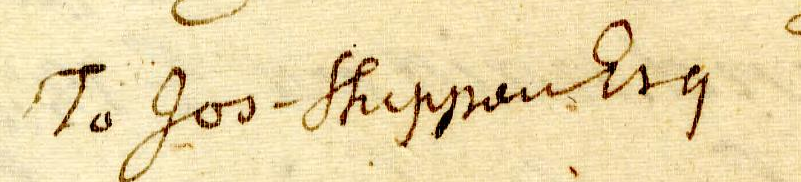To Jos- Shippen Esq
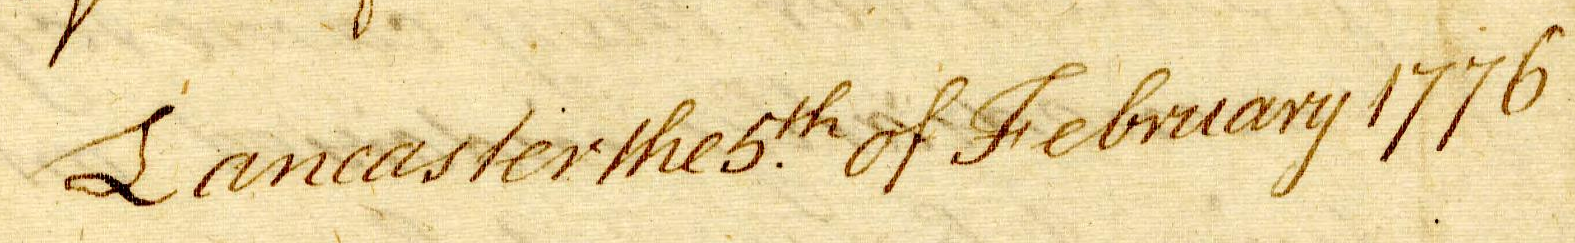Lancaster the 5^th. of February 1776
